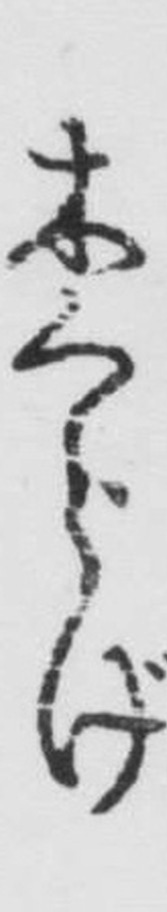木くらげ
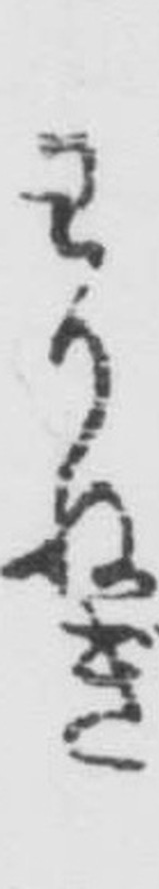わりねぎ
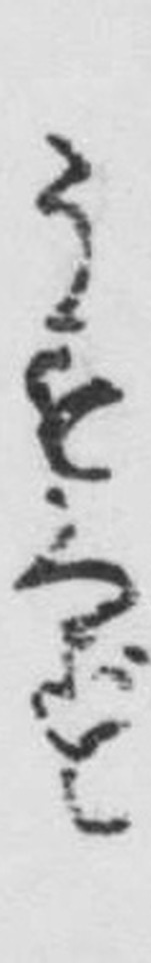うすくず
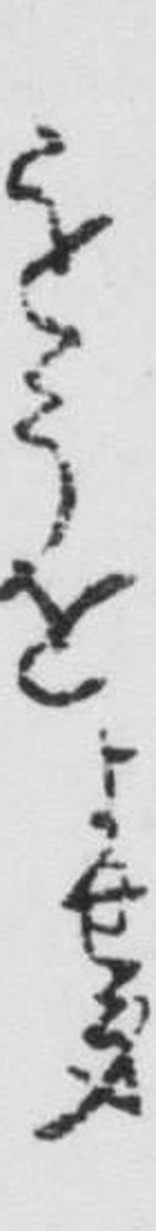近うをよせ身
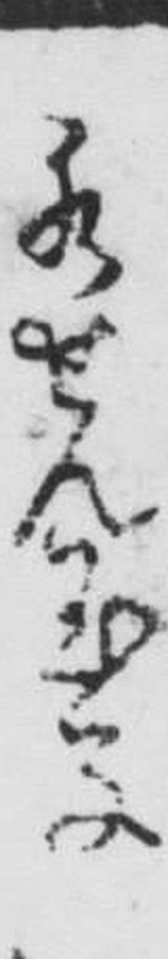水せん玉子
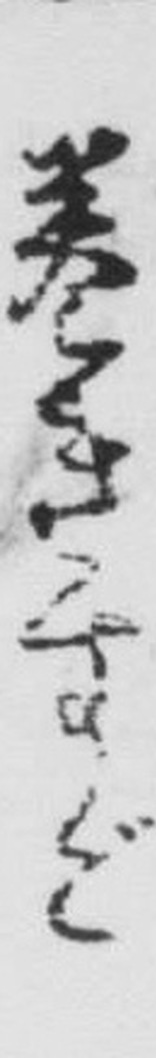巻きすご
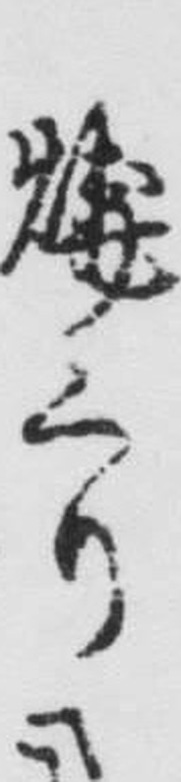焼くり
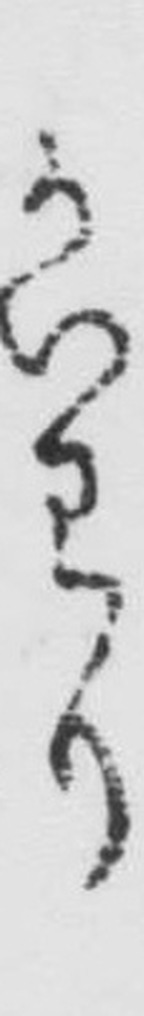かいわり
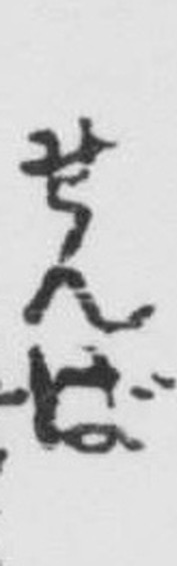せんば
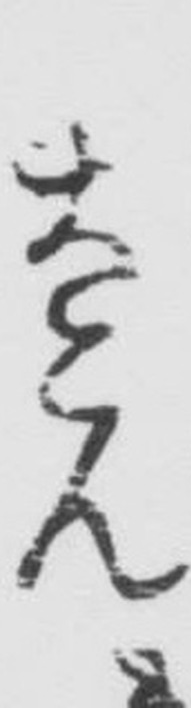大こん
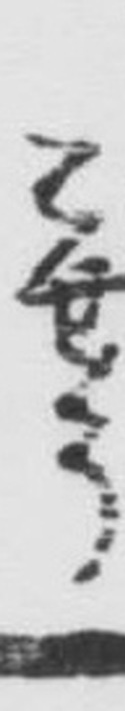こせう
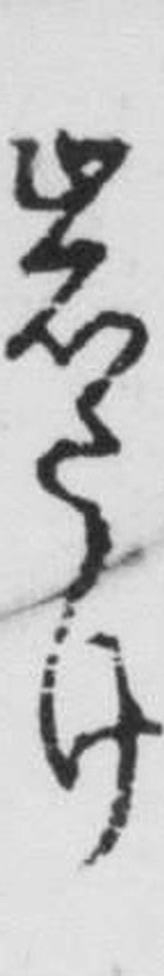岩たけ
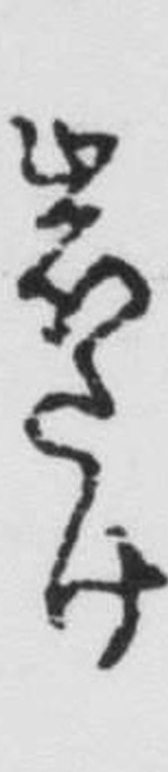岩たけ
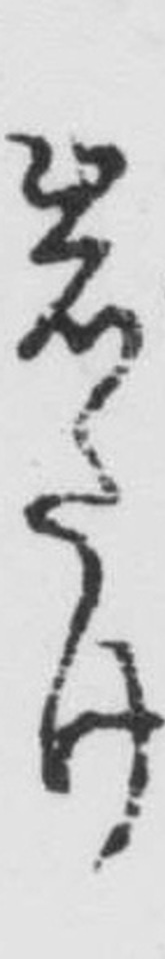岩たけ
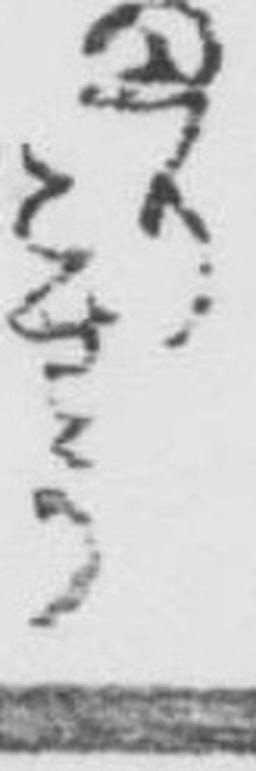こせう
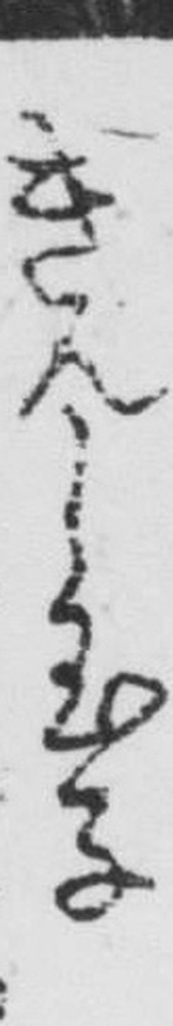きんし玉子
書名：諸家通用/即席料理
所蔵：大阪府立大学学術情報センター 国文学研究資料館
